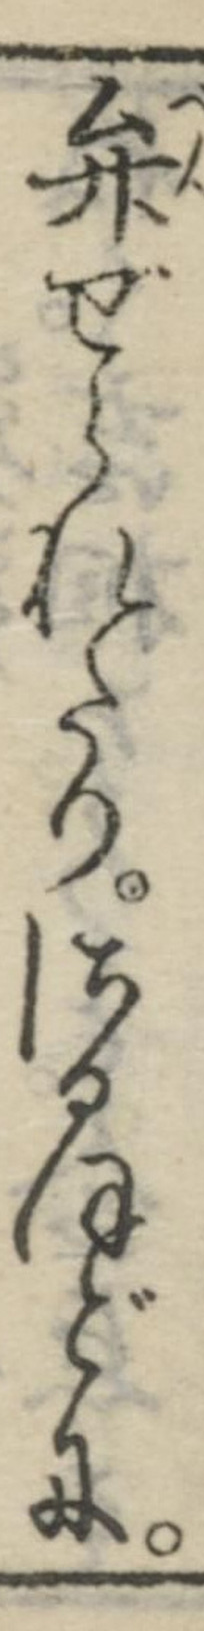弁ぜられたり。さるほどに。
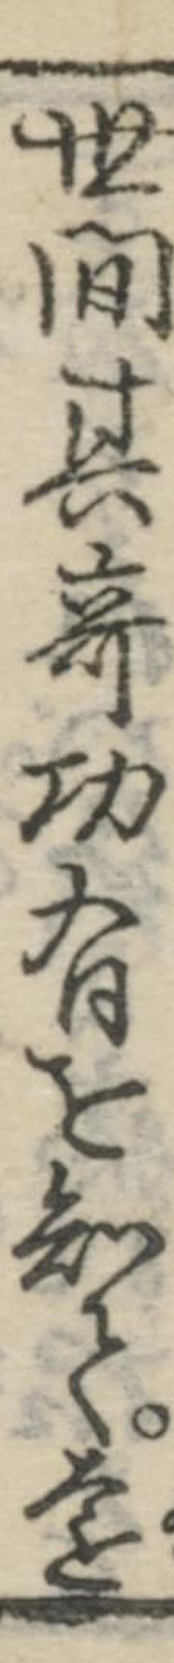世間其奇功有を知て。遠
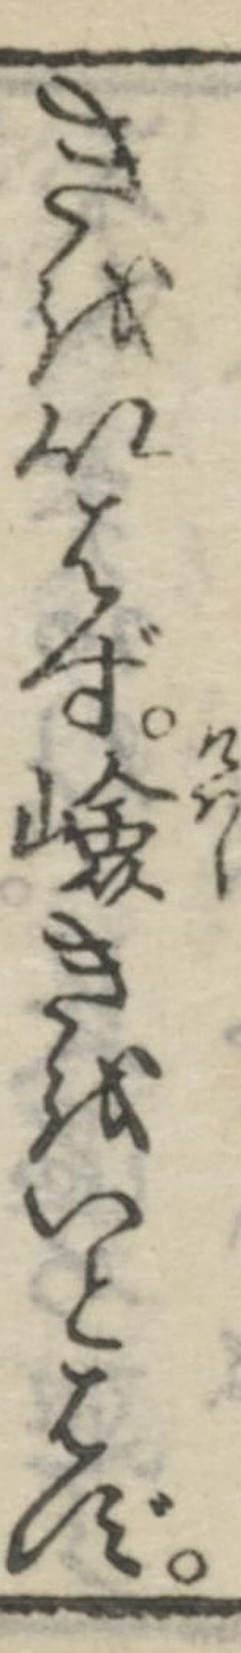きをいはず。険きをいとはず。
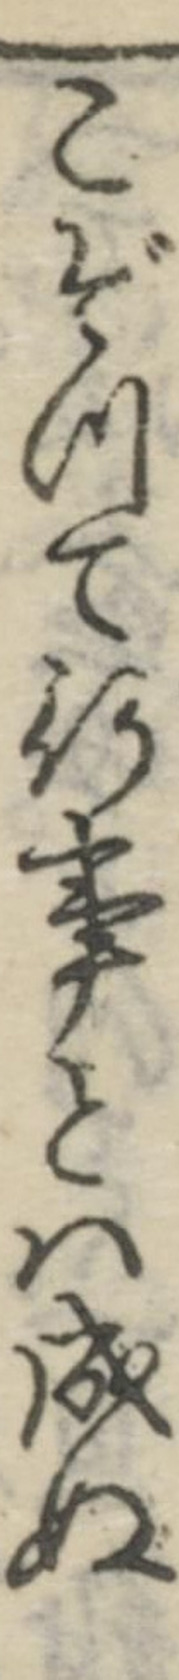こぞつて行事とは成ぬ
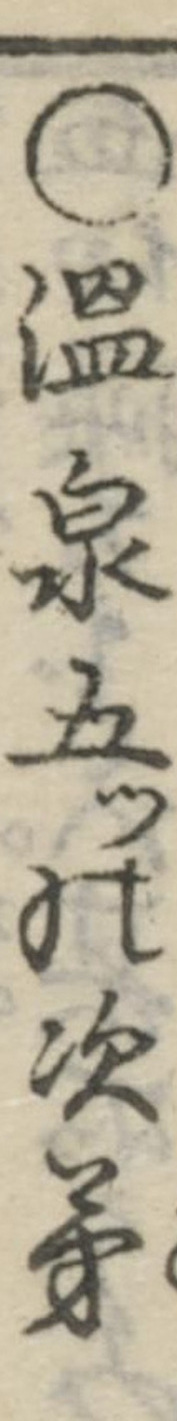〇温泉五ツの次第
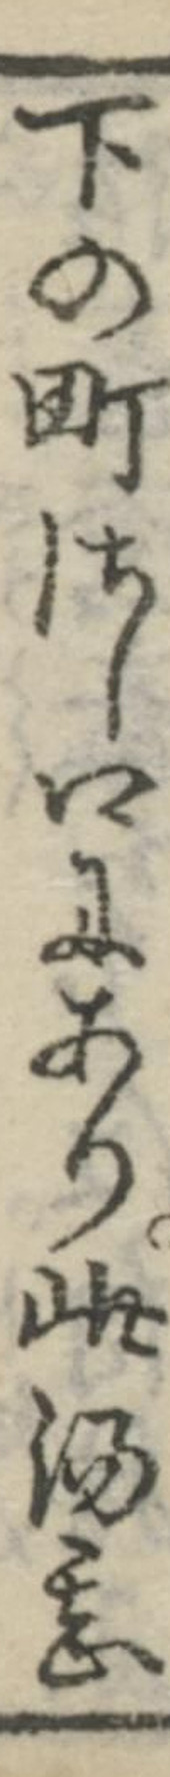下の町さし口にあり。此湯甚
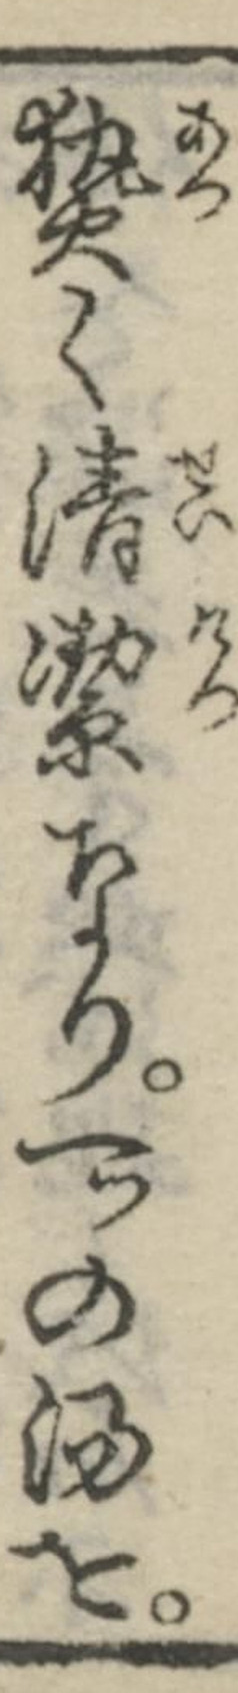熱く清潔なり。一ツの湯を。
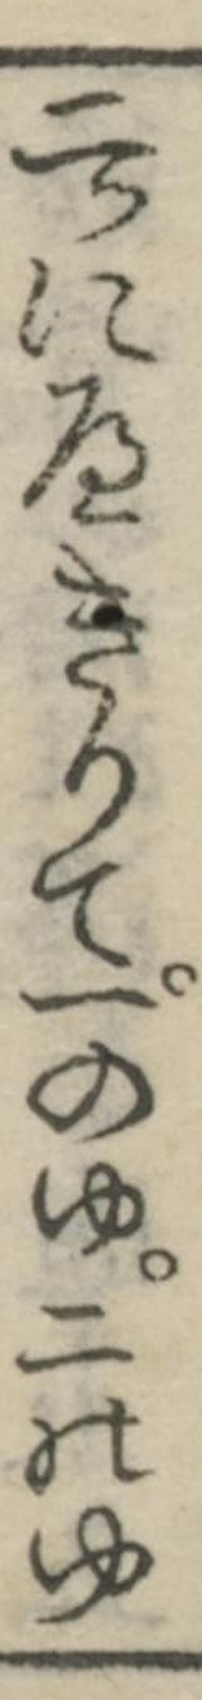二ツにへきりて。一のゆ。二のゆ
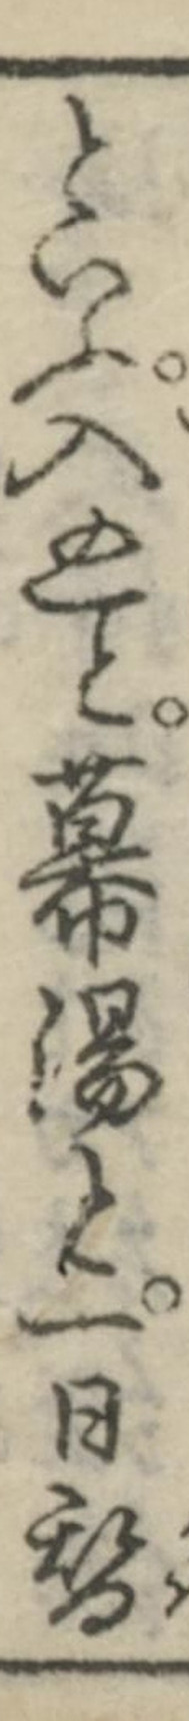といふ。入込と。幕湯と。一日替
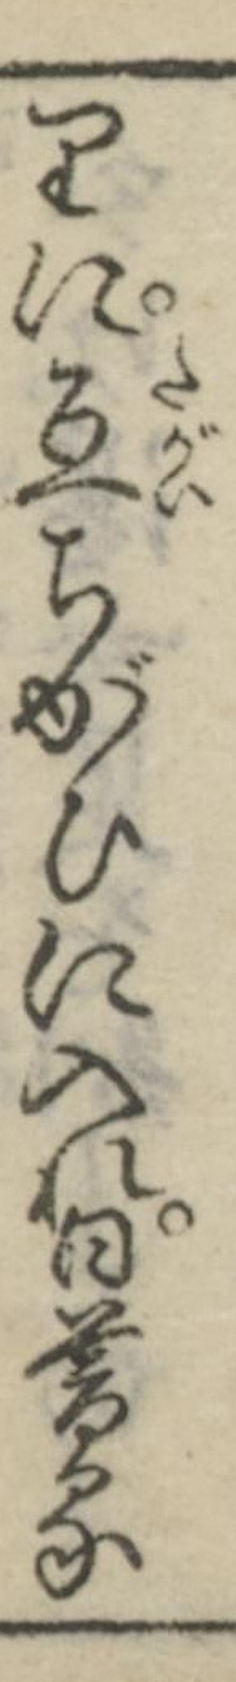りに。互ちがひに入れ。日暮る
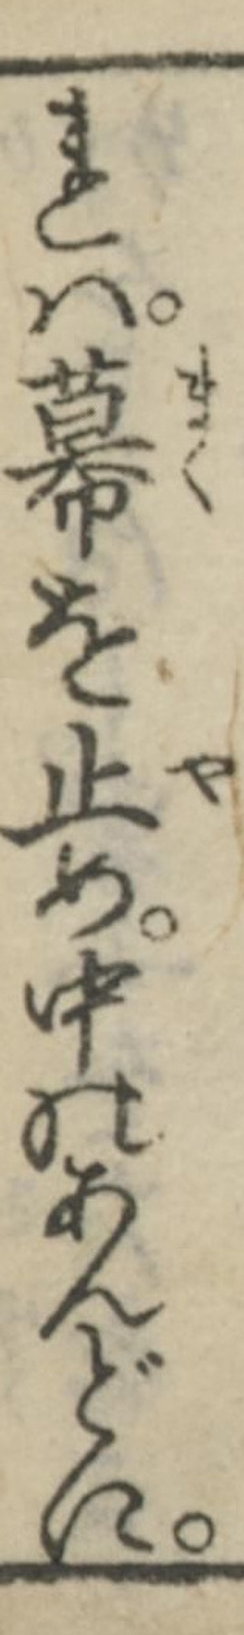れは。幕を止め。中のあんどに。

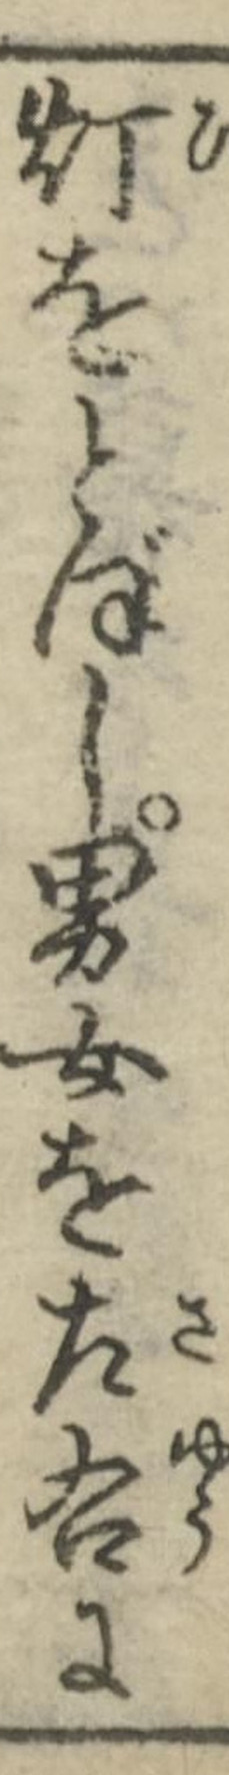灯をとぼし。男女を左右に
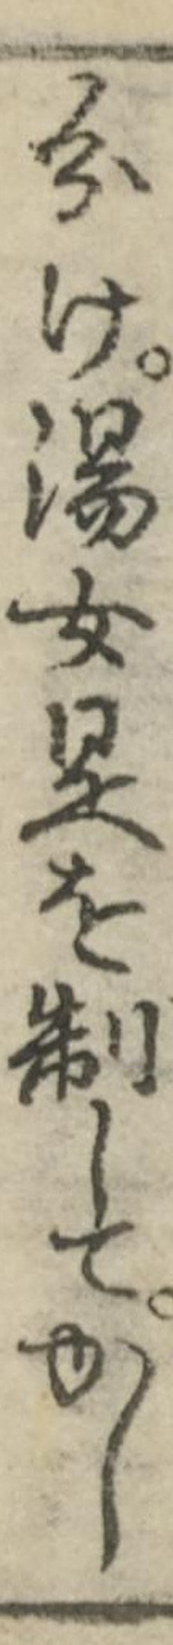分け。湯女是を制して。かく
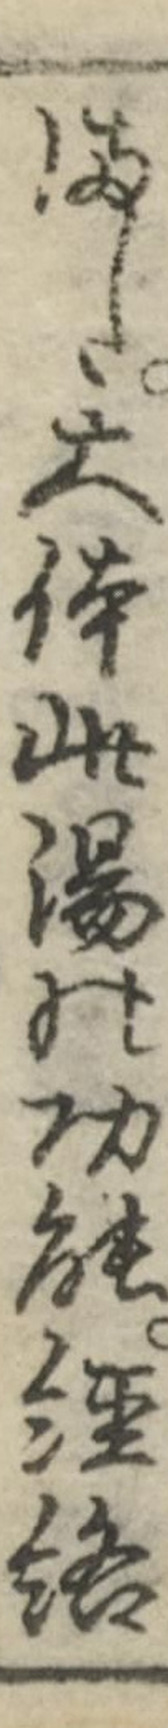また。大体此湯の功能。経絡
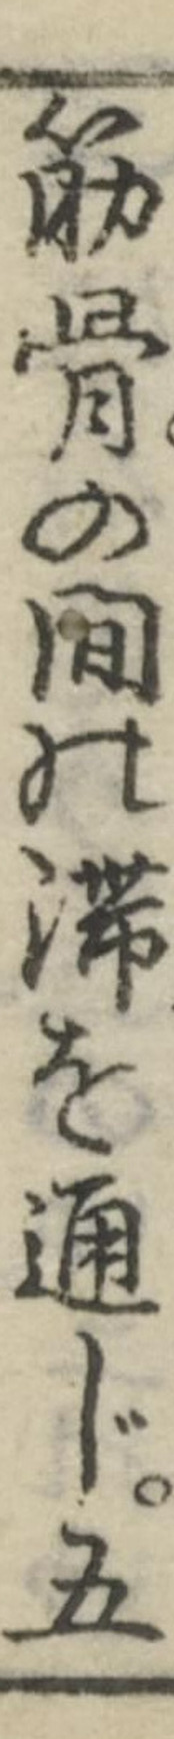筋骨の間の滞を通じ。五
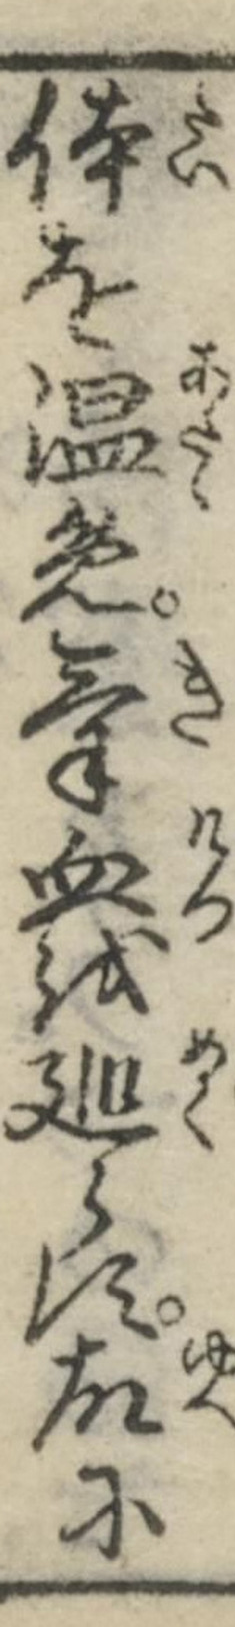体を温め。気血を巡らす。故に
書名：但州城崎浴湯辧
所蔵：東京大学地震研究所図書室 Earthquake Research Institute Library, The University of Tokyo, JAPAN
